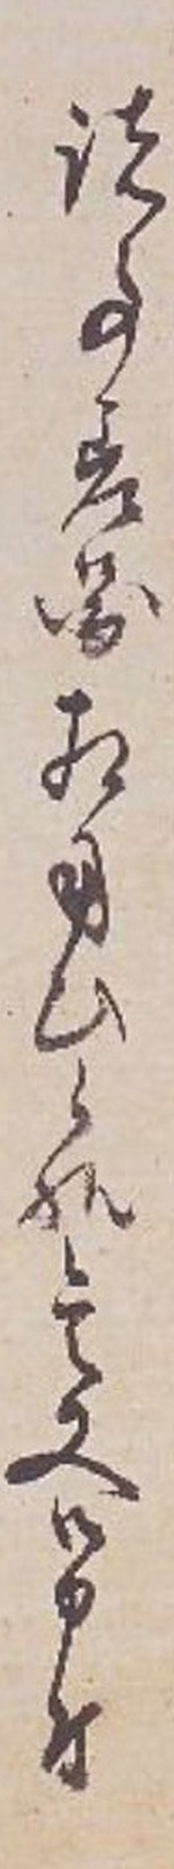諸事差図相用ひ候様是又御申付
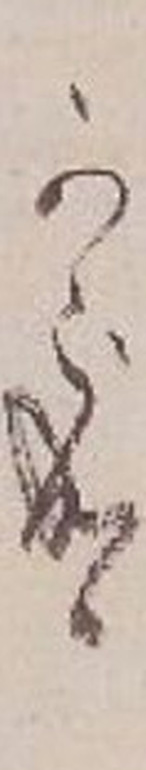可被成候
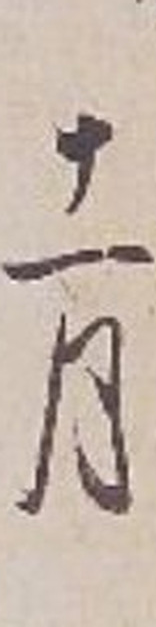十一月
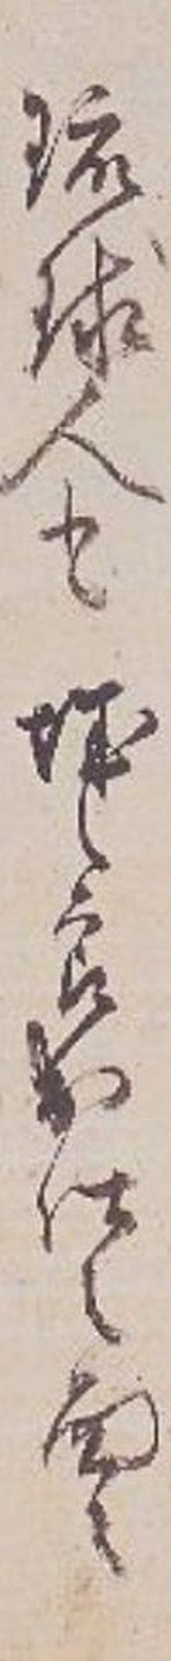琉球人登城候節出仕之面々
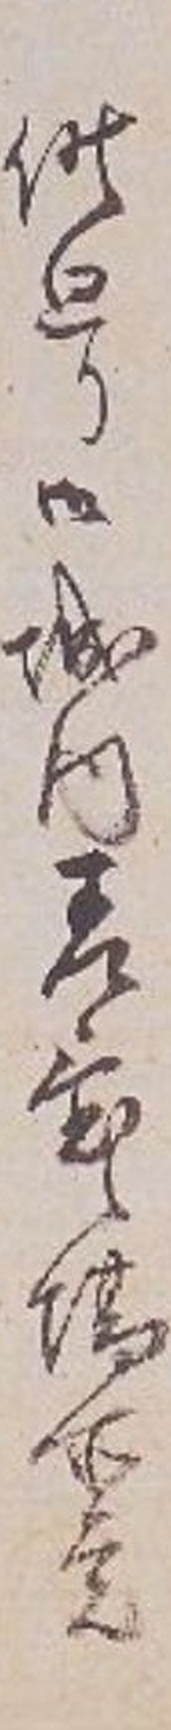供廻り御城内差置候場所覚
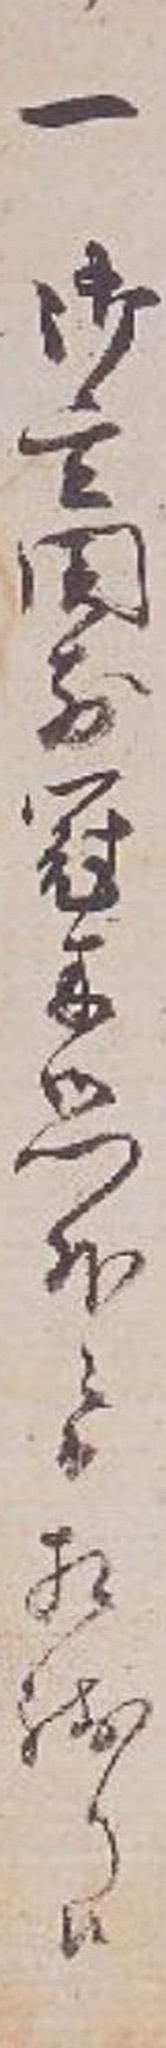一御玄関前冠来御門外ニ而相残り候

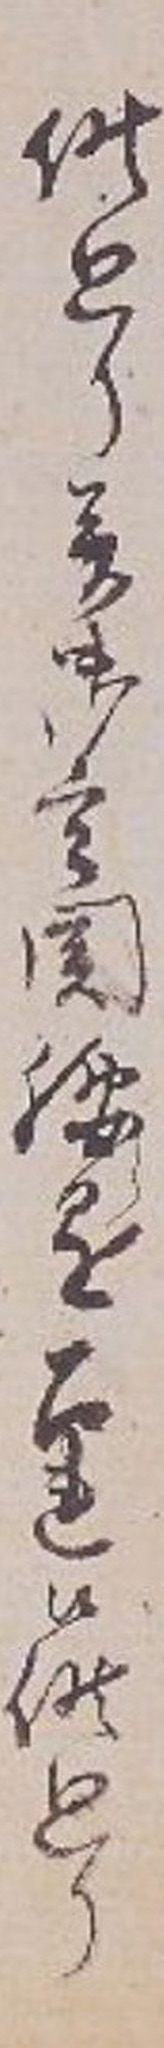供廻り義御玄関腰懸召連候供廻り
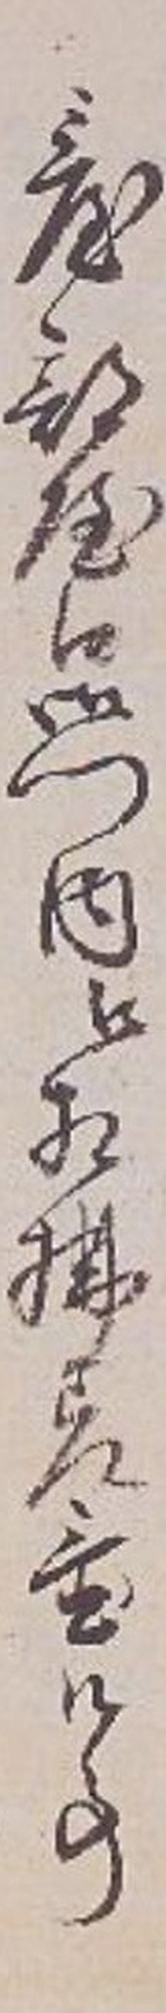臺部屋口御門内江相払差置候事
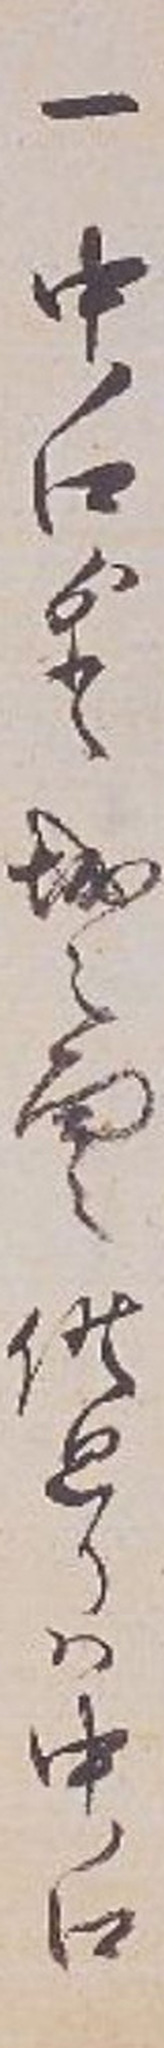一中ノ口ゟ登城之面々供廻りハ中ノ口
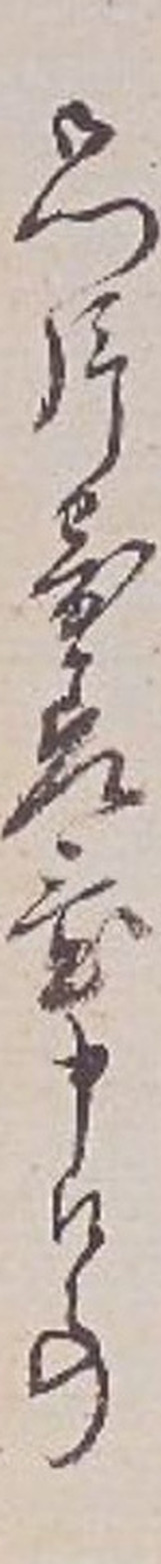御門片寄差置申候事
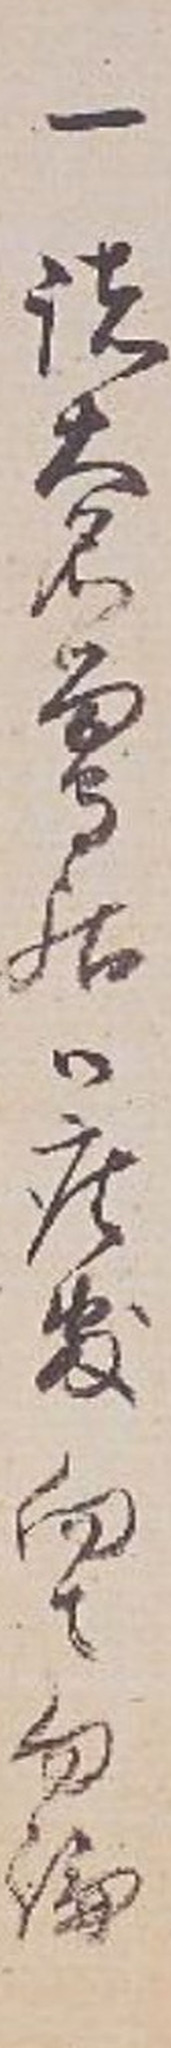一諸大名留守居御座敷向者勿論
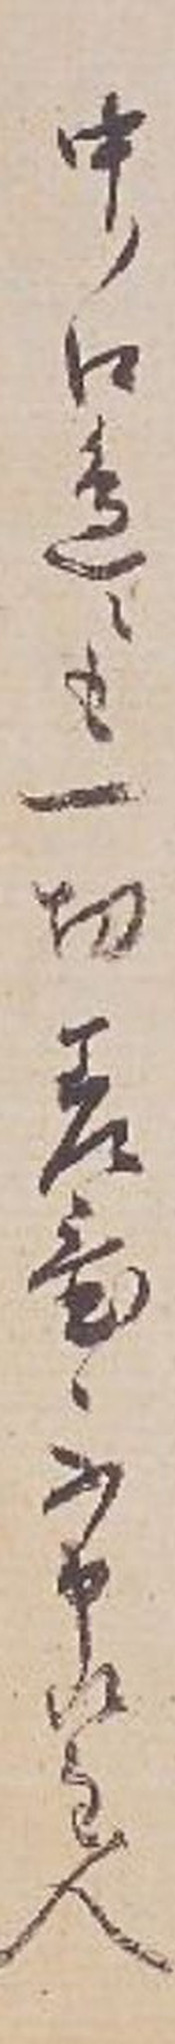中ノ口辺ニも一切差置不申候主人
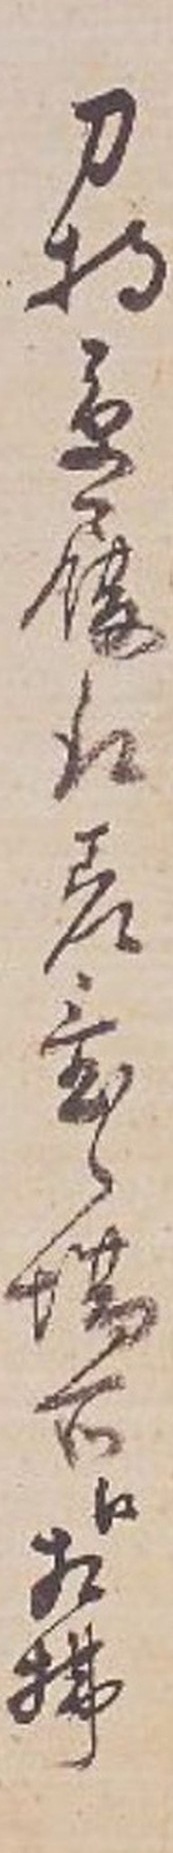刀持草履取差置候場所江相払
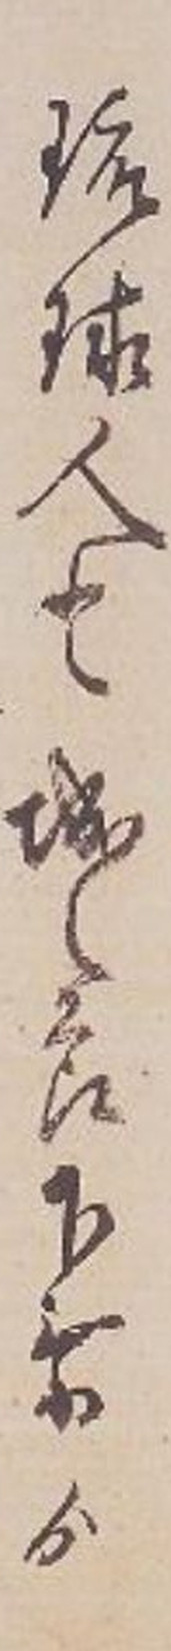琉球人登城之節下乗ゟ
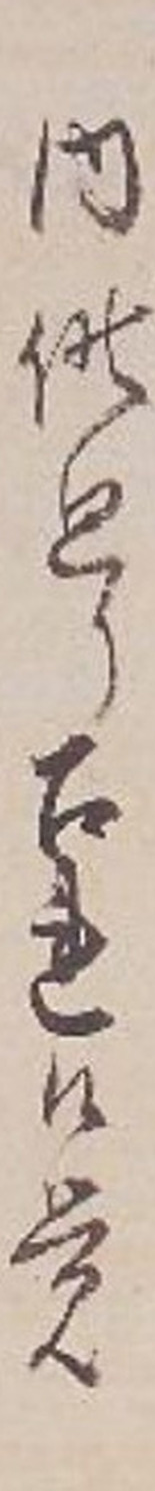内供廻り召連候覚
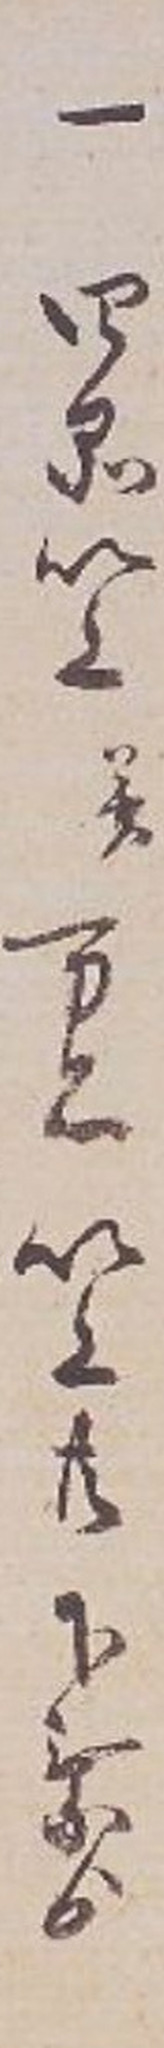一四品以上幷万石以上共下乗ゟ
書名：琉球人来朝記 一、二
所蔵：University of the Ryukyus Library
